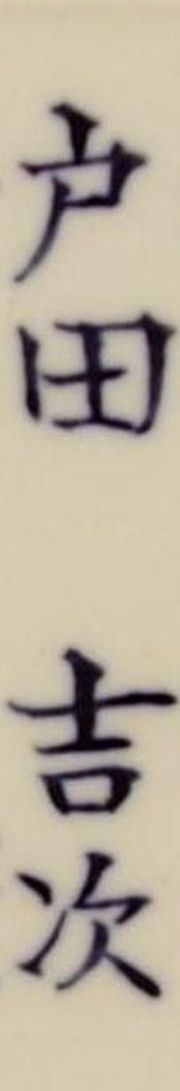戸田吉次
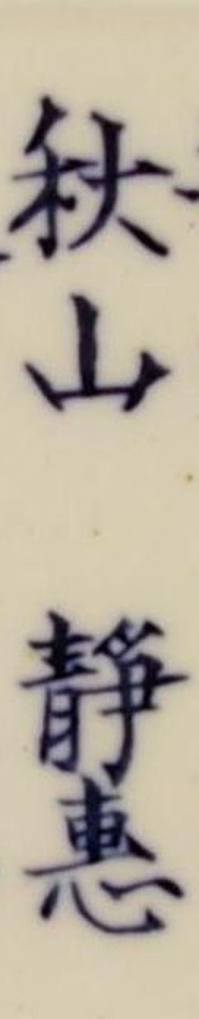秋山静恵
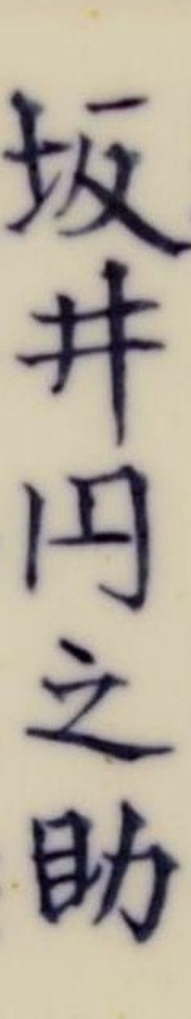坂井円之助
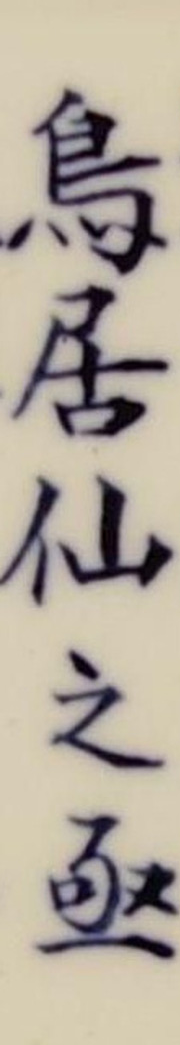鳥居仙之丞
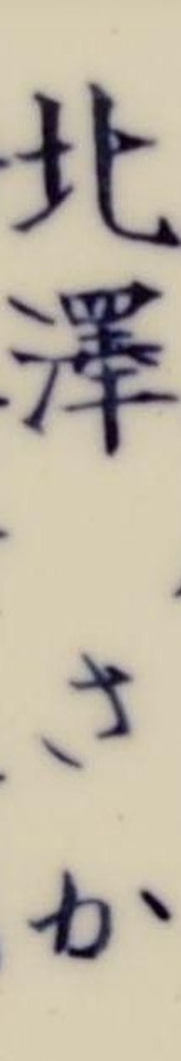北澤さか
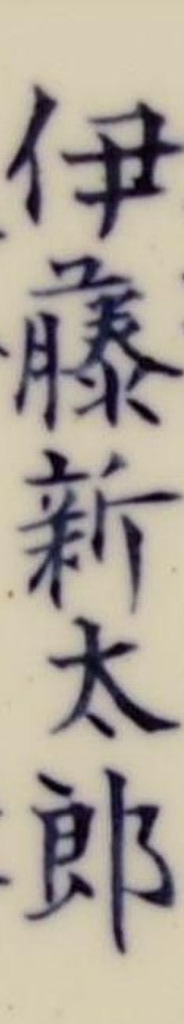伊藤新太郎
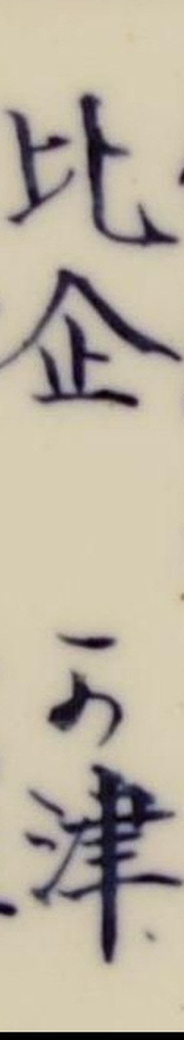比企かつ
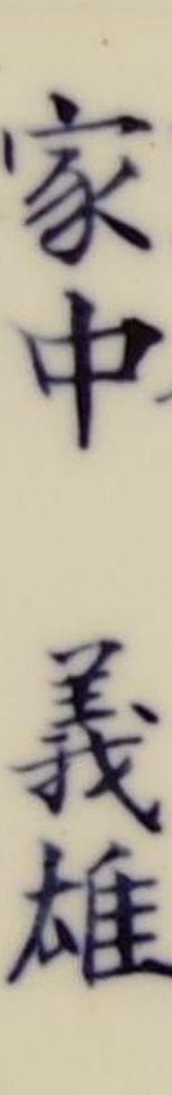家中義雄
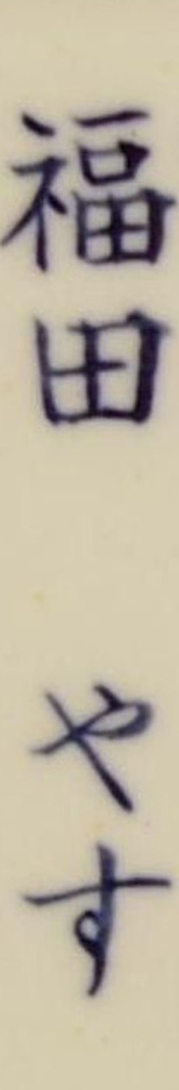福田やす
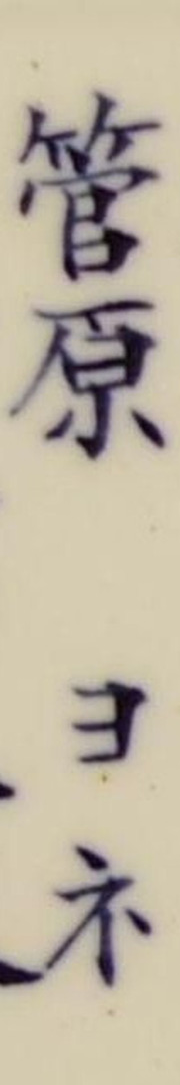管原ヨネ
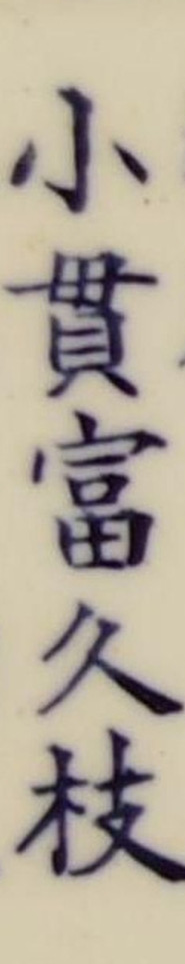小貫富久枝
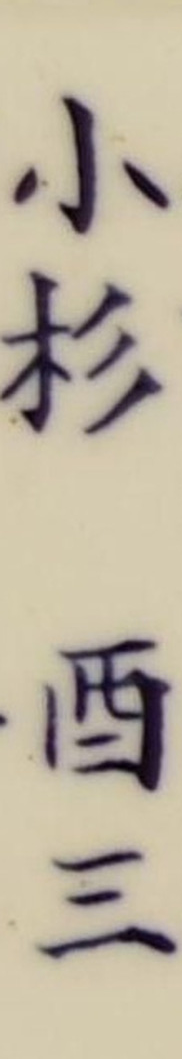小杉酉三
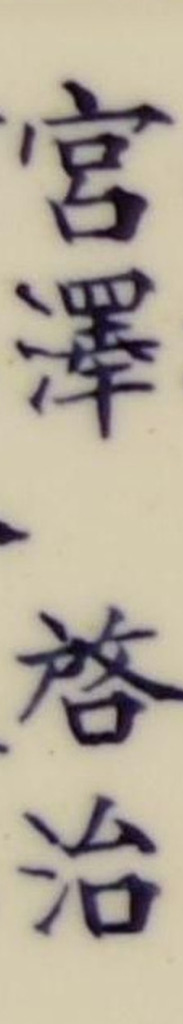宮沢啓治
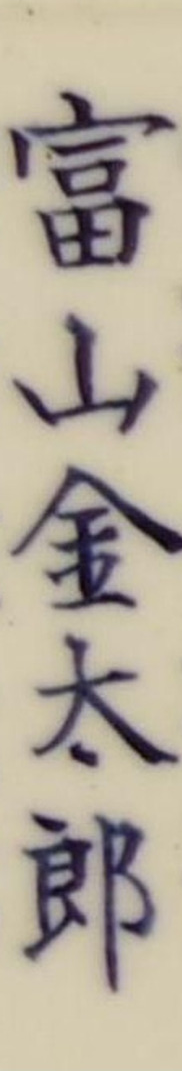富山金太郎
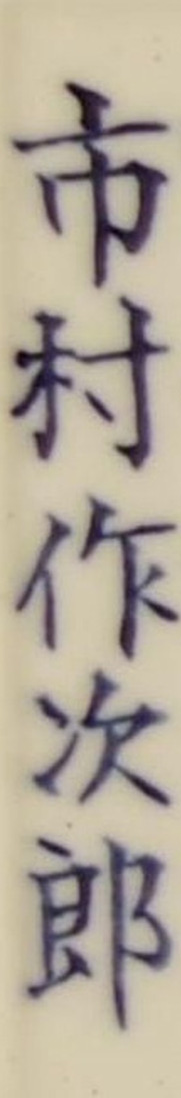市村作次郎

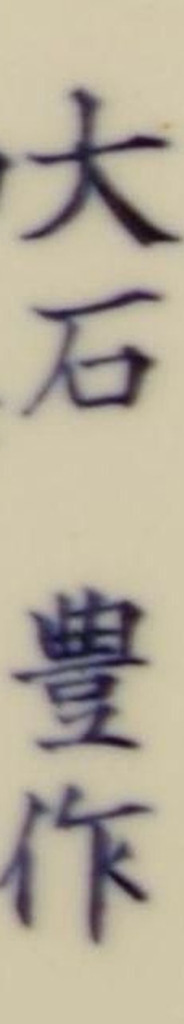大石豊作
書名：E~L
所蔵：高野山金剛峯寺
